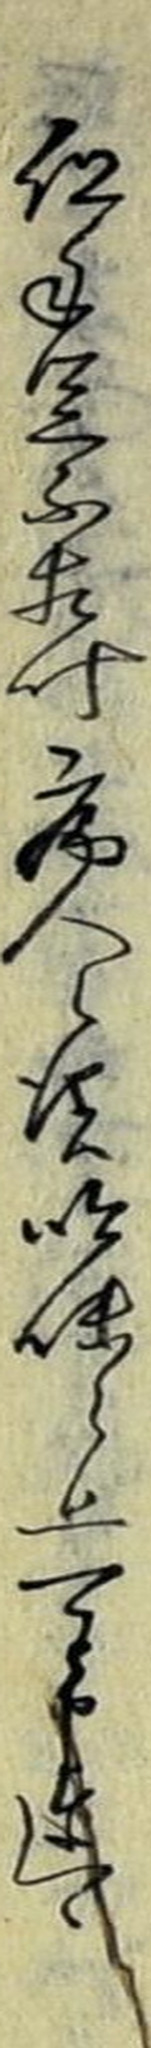但手足不相叶病人之儀ハ吟味之上可被申達候
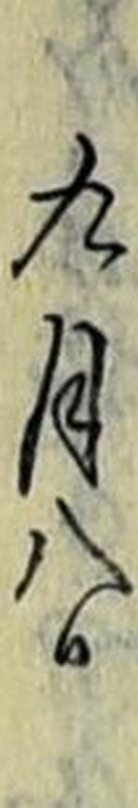九月八日
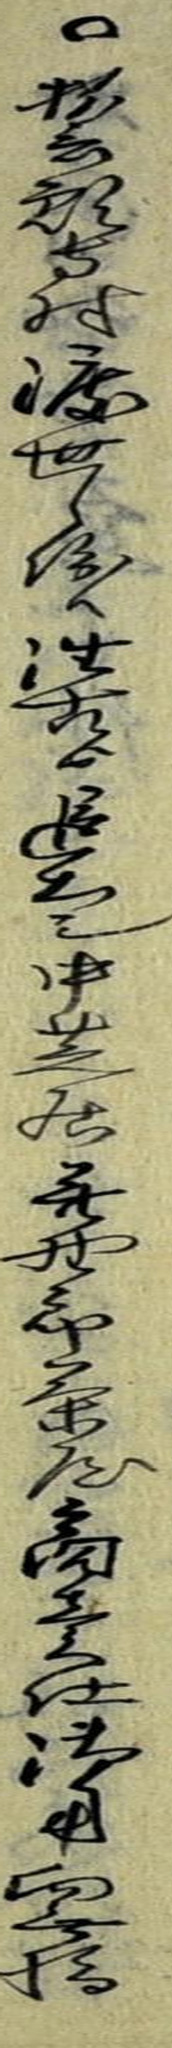〇誓願寺村渡世之儀ハ往古ゟ追出シ中芝居并野郎茶屋商売仕御用向無指
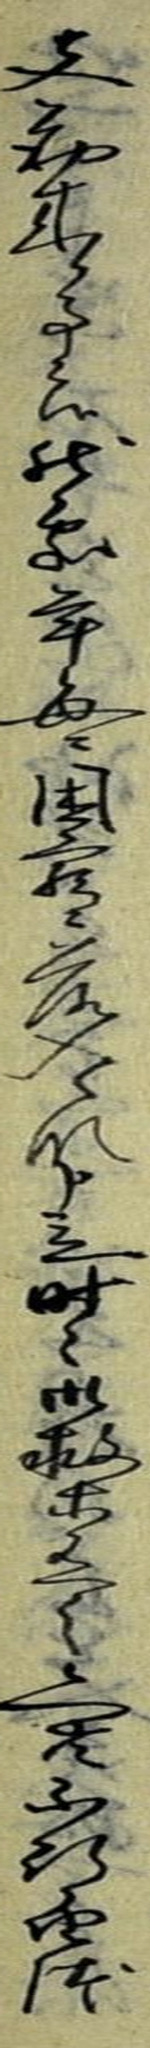支勤来候事ニ候然処年毎ニ困窮ニ落入候段申立時々御救等有之候へ共不行届体
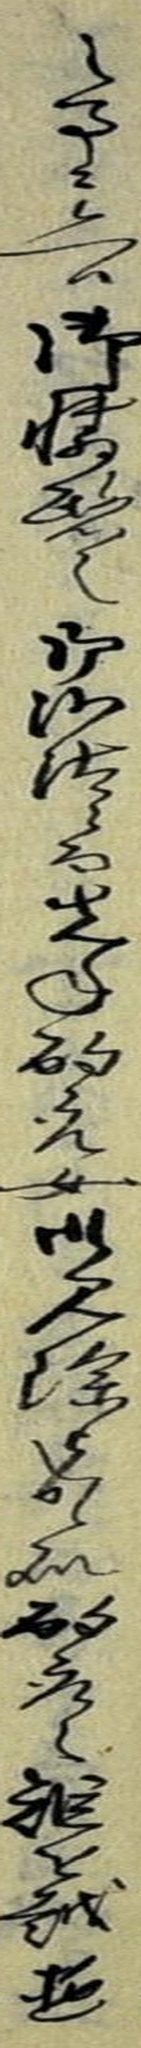之事ニ候へハ御憐愍之御沙汰ニ而先年酌取女御見除被成候処酌取之矩を越遊
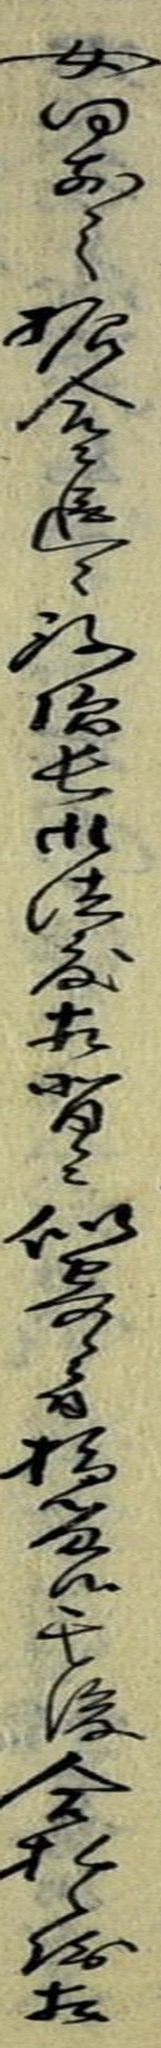女同前之振合ニ追々致増長御法度相背ニ似寄候ニ付指留候其後合札之儀相
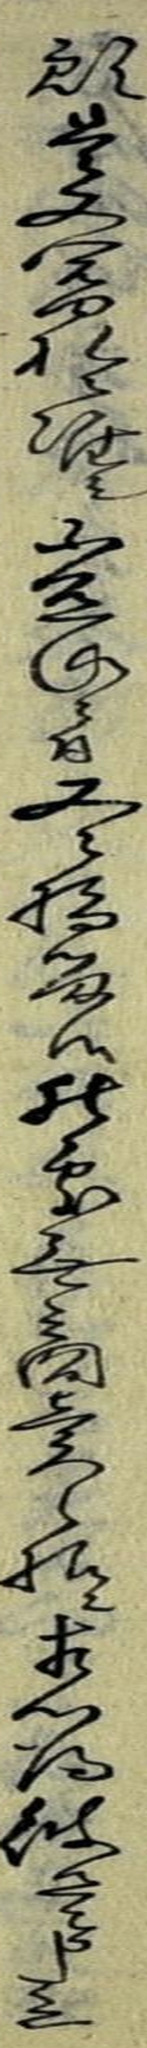願是又富札ニ准シ不宜趣ニ付又々指留候然処無商売之様ニ相心得彼是申立
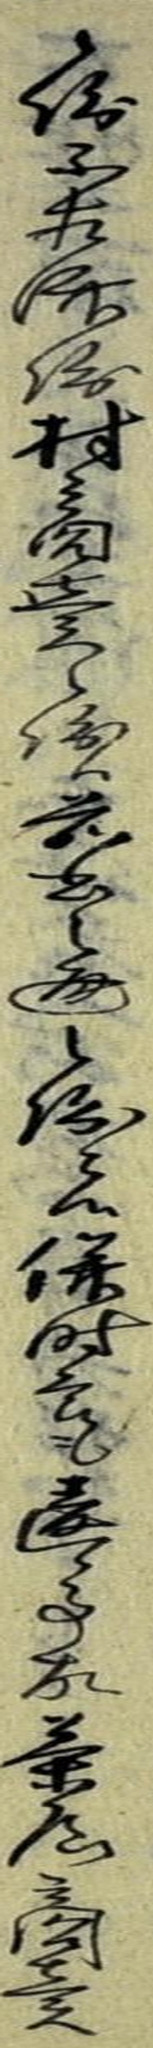之儀不相済儀村商売之儀ハ前書之通之儀ニ候併時節も違候事故茶屋商売
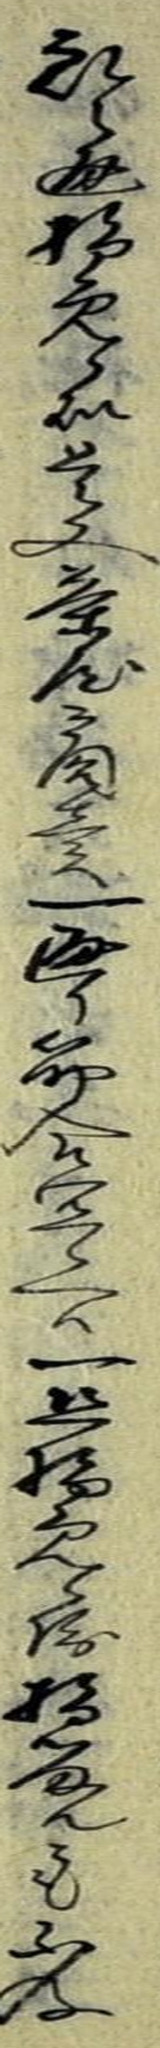願之通指免候処是又茶屋商売一通り筋合宜候ヘハ一旦指免候儀指留ルニも不及
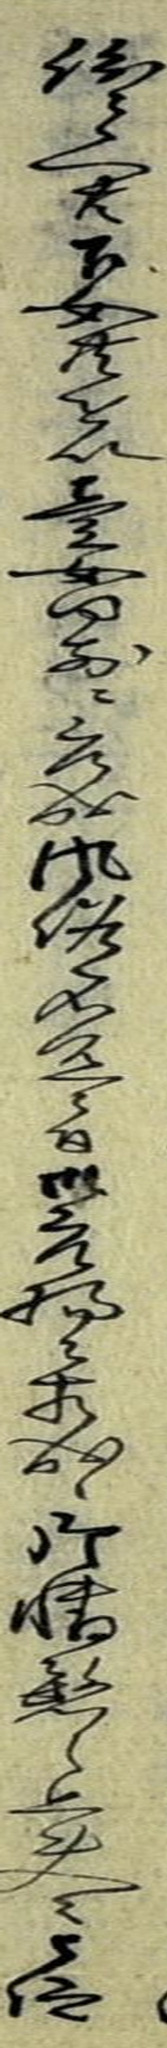儀ニ候へ共下女共を以売女同前ニ取成風俗不宜ニ付御取揚ニ相成候御憐愍之上夫々被仰
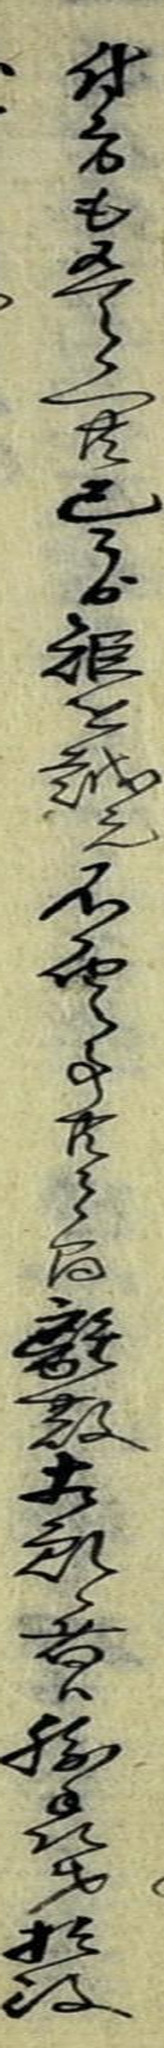付方も有之候へ共ゟ矩を越え不届之事共ニ候間離散相願候者ハ勝手次第於役
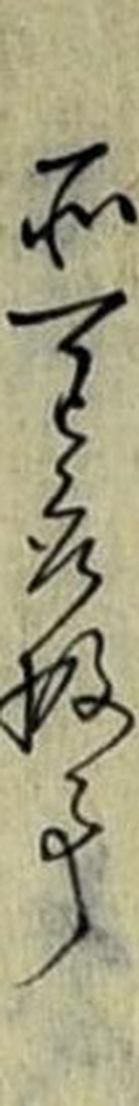所可被取扱事
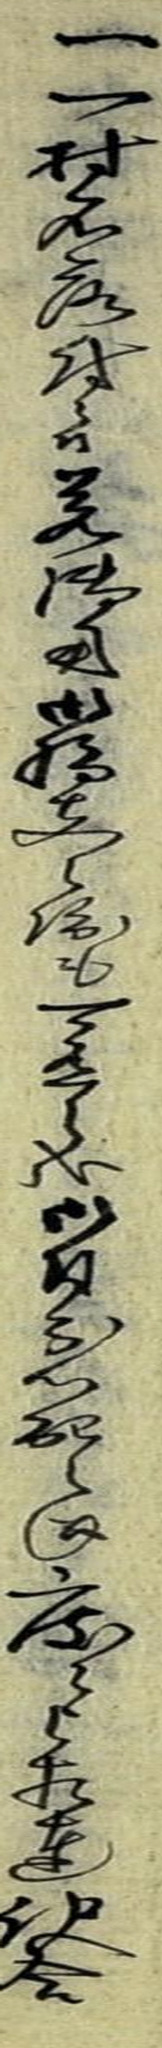一一村不落付ニ付若御用御指支之儀も可有之哉御自分心配之趣度々被相達訳合
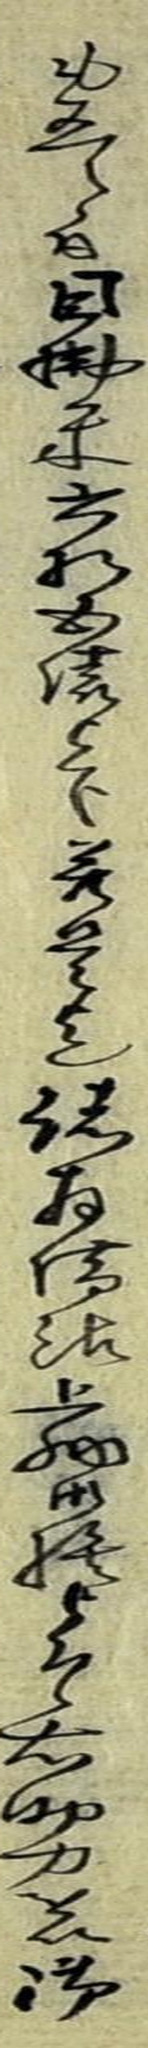も有之ニ付目払米六拾五俵被下并是迄諸拝借銀上納御捨被下候右助力を以御
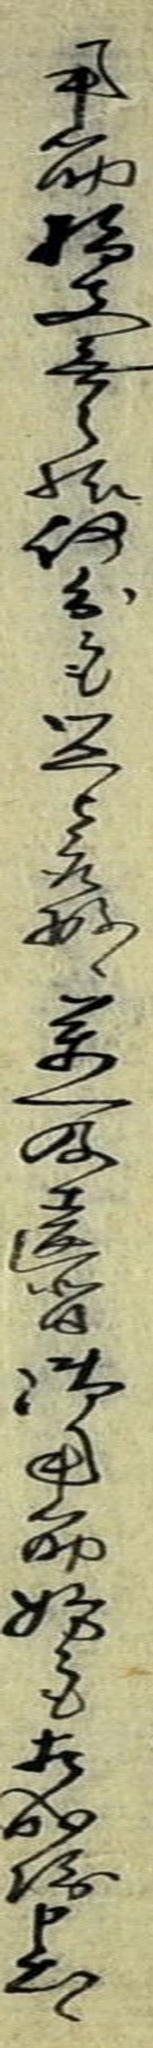用筋指支無之様何分ニも宜被取扱候万一及違背御用筋妨ニも相成儀申出候
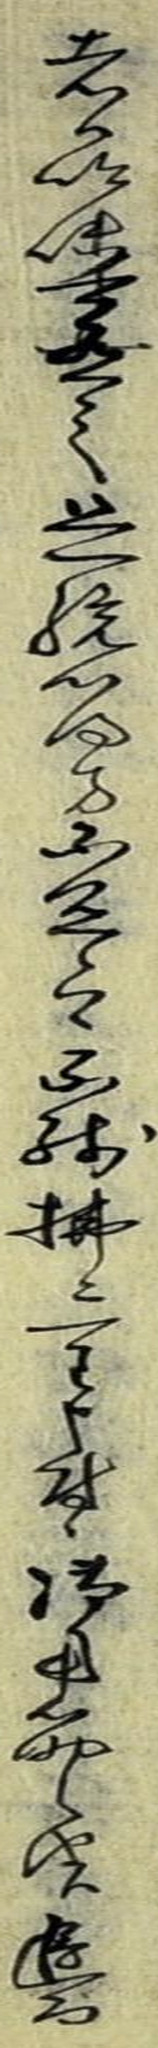者ハ吟味可有之且一統心得方不宜候ハヽ不残払ニ可被申付候御用筋之儀ハ追而
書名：命令之部 三
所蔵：福井県文書館 Fukui Prefectural Archives
